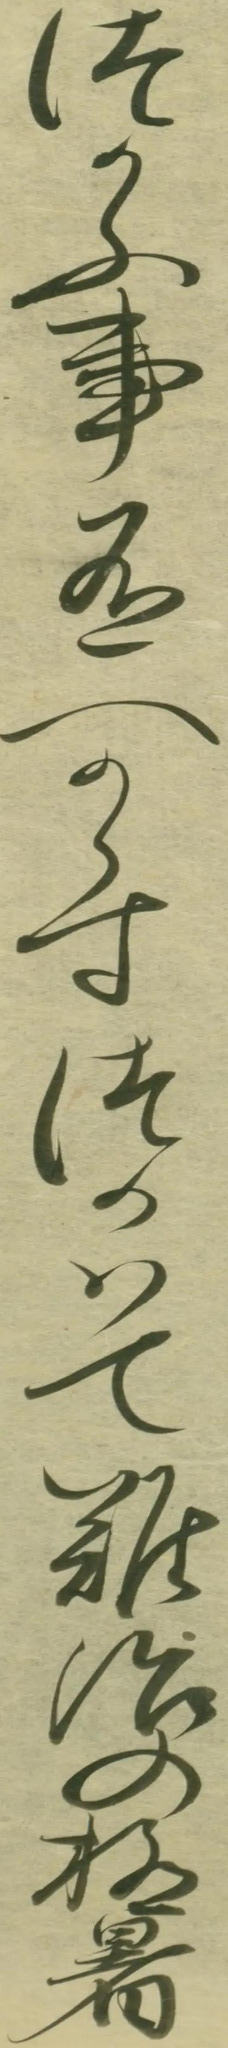つかふ事有へからすつかはて難治の極暑
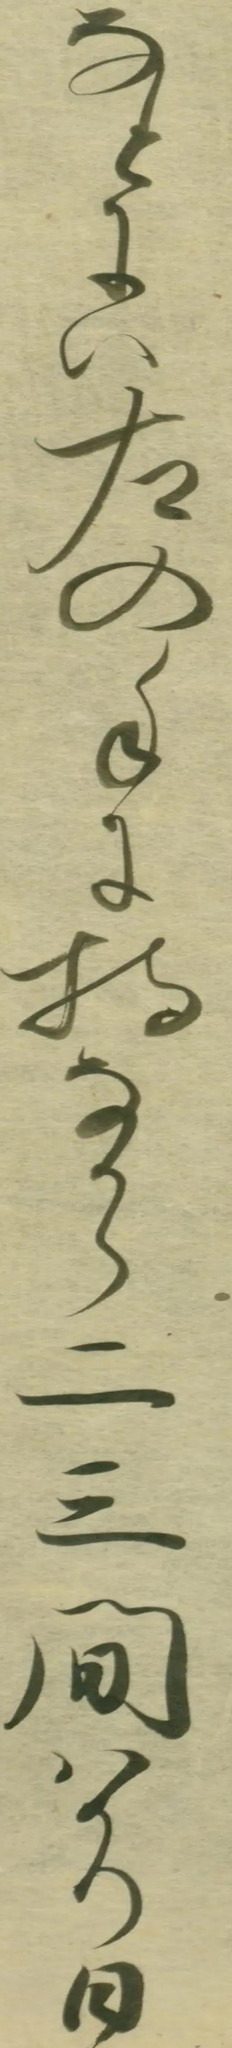なとには左の手に持なから二三間はかりひ
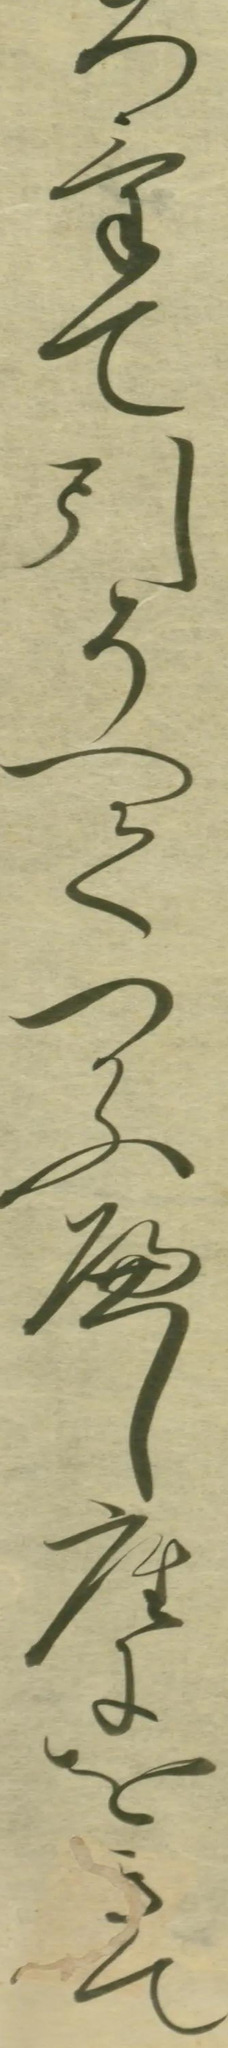ろけて引そへてつかふへし庭にをきて
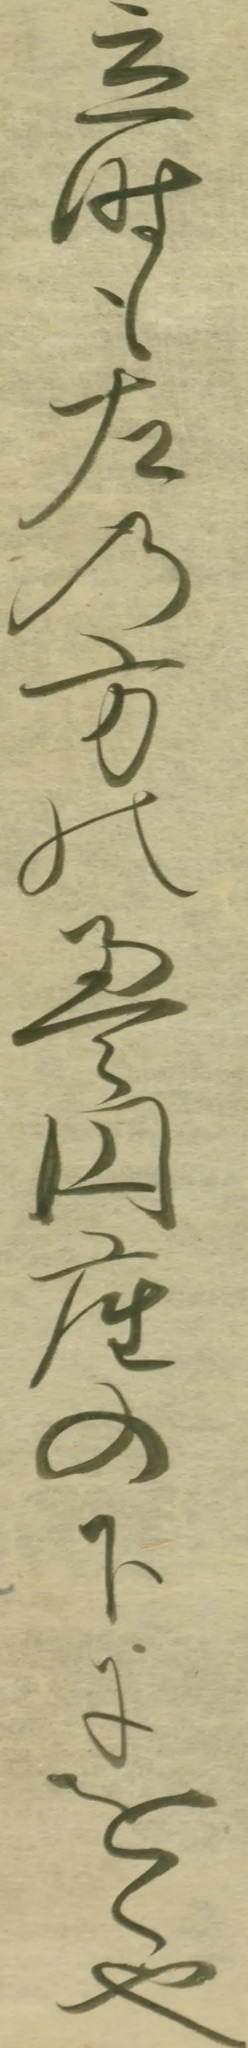立時も左の方の畳円座の下にをく也
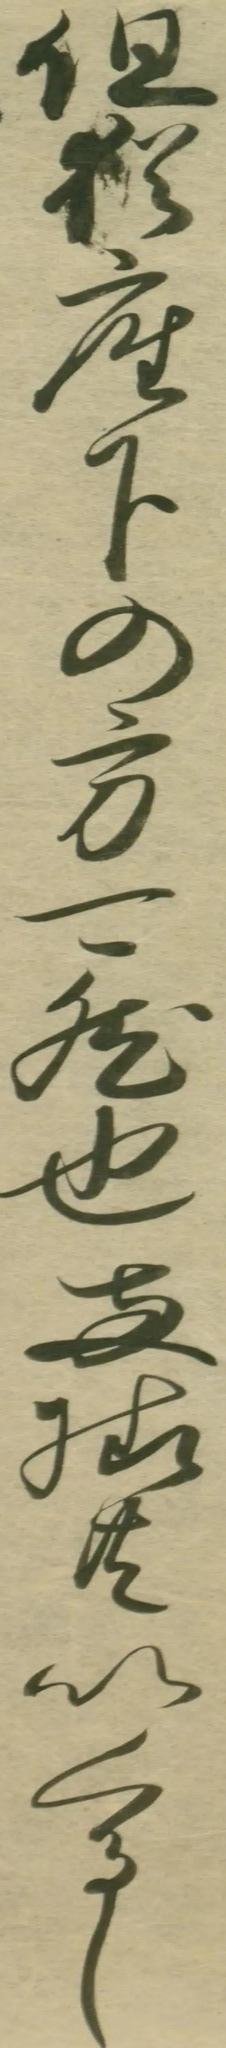但猶座下の方可然也両様共以くるし

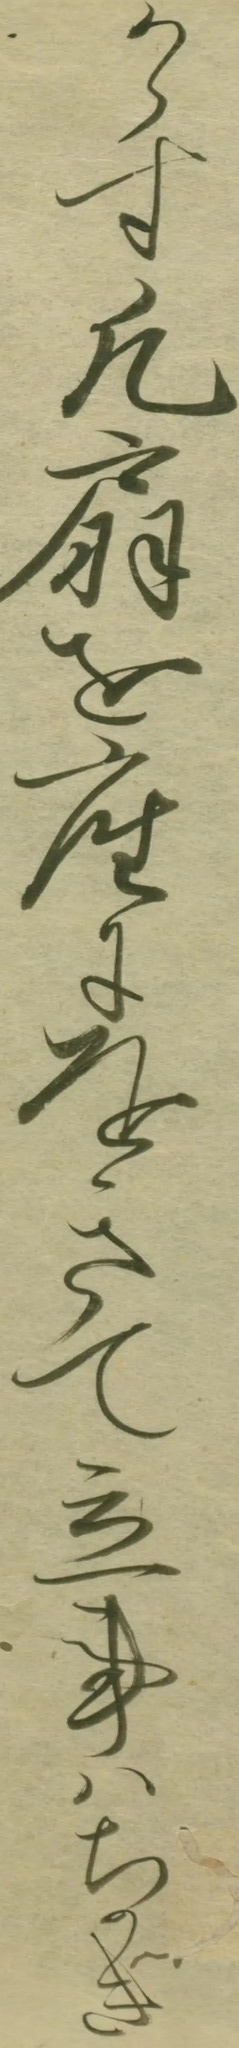からす凡扇を座にをきて立事はちかき
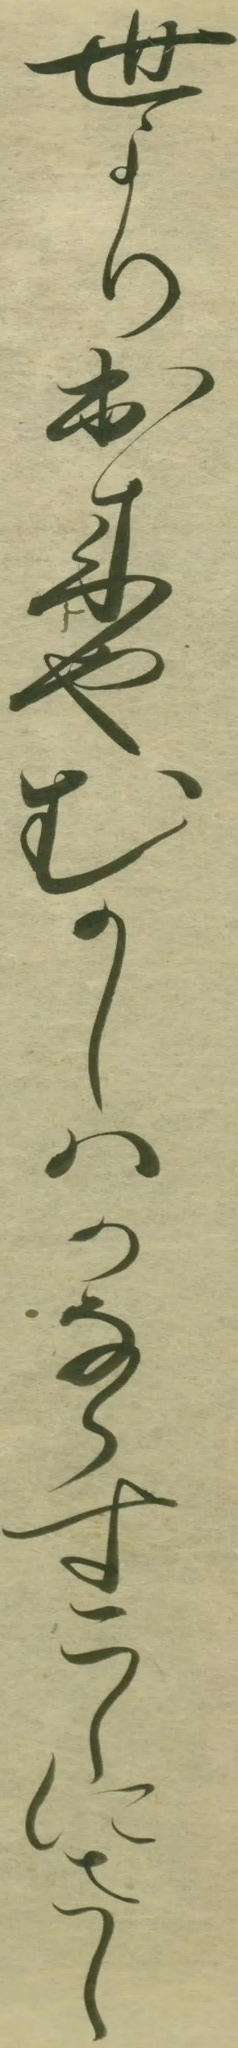世より出来也むかしはかならすこしにさし
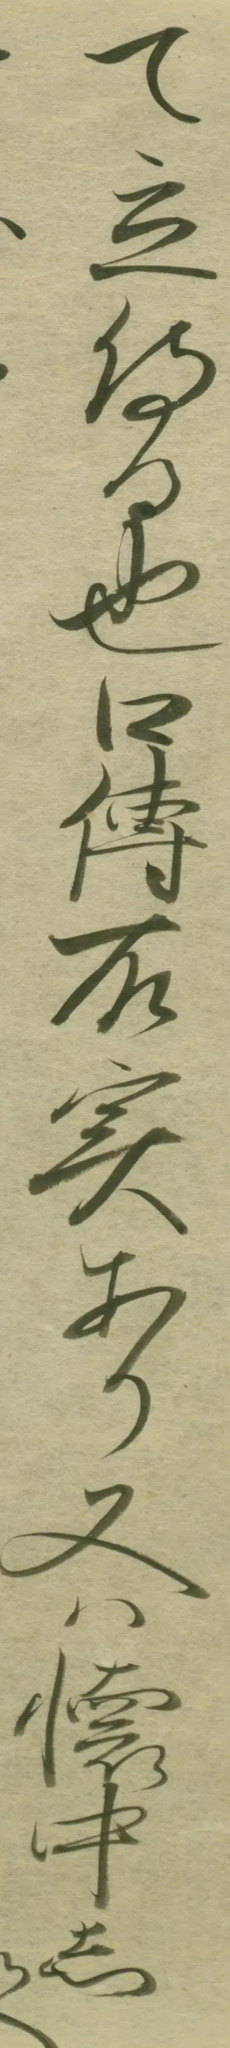て立侍る也口伝故実あり又は懐中して
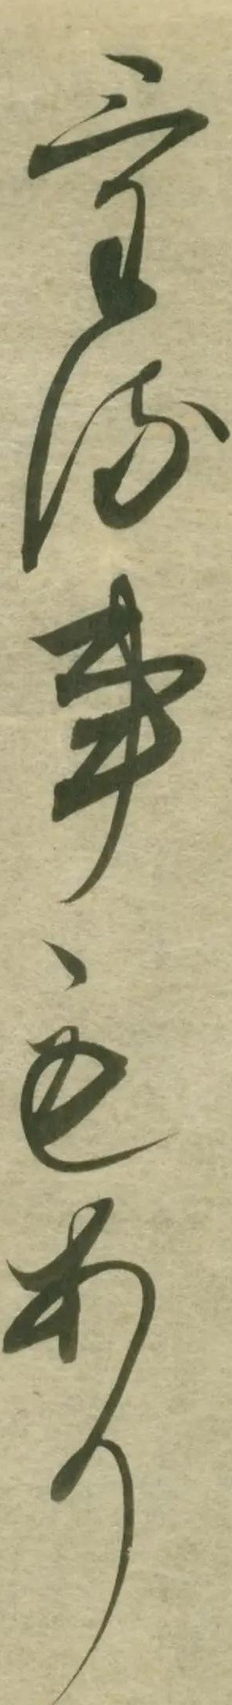ける事もあり
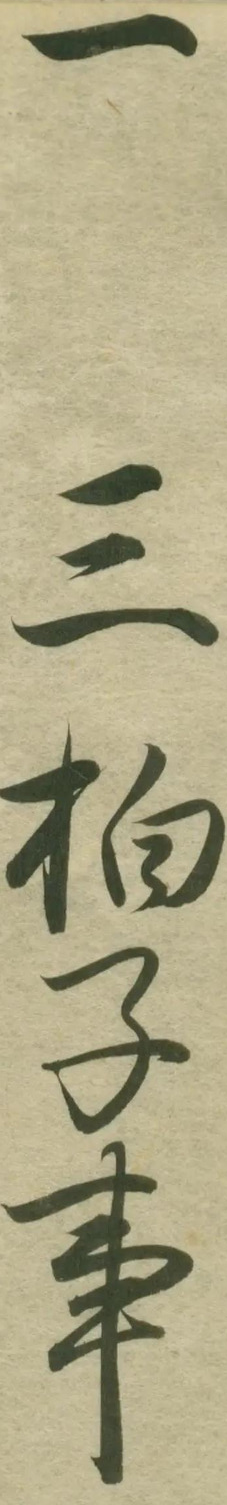一三拍子事
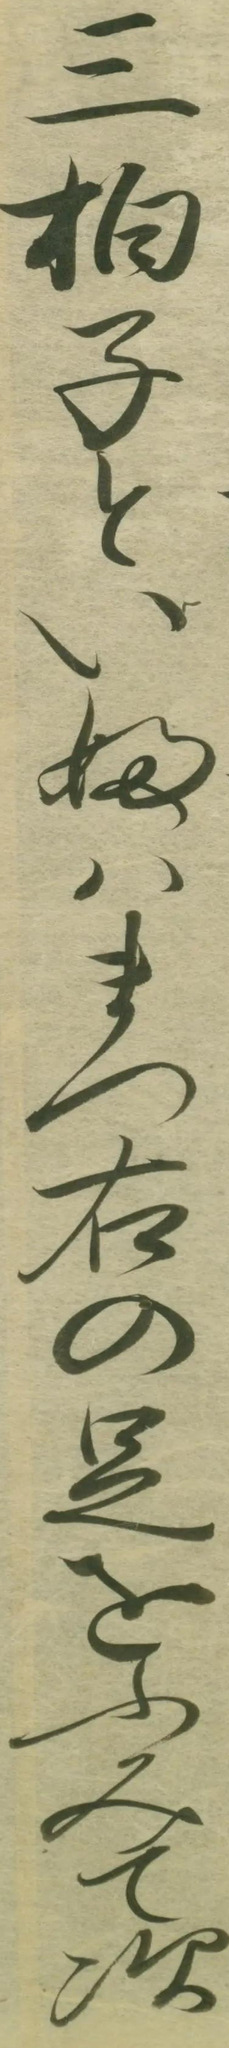三拍子といふはまつ右の足をふみて次
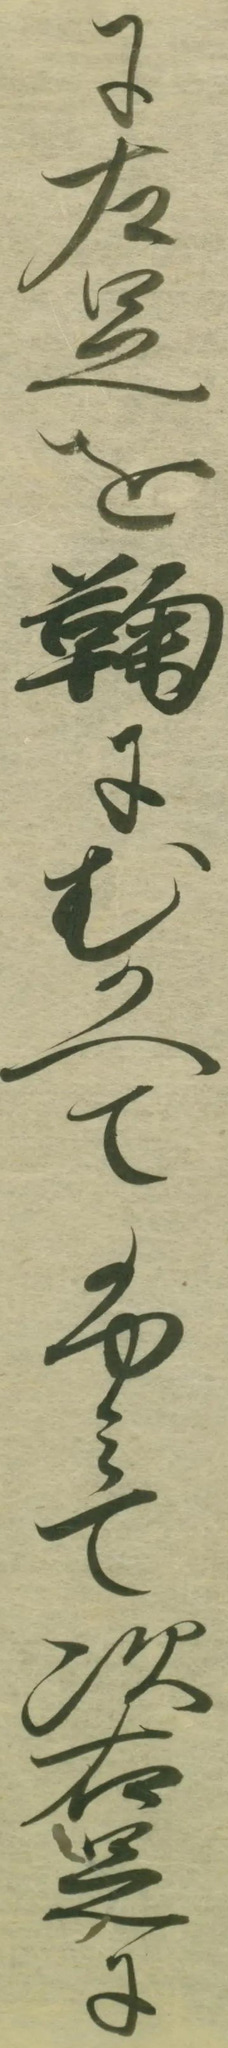に左足を鞠にむかへてふみて次右足に
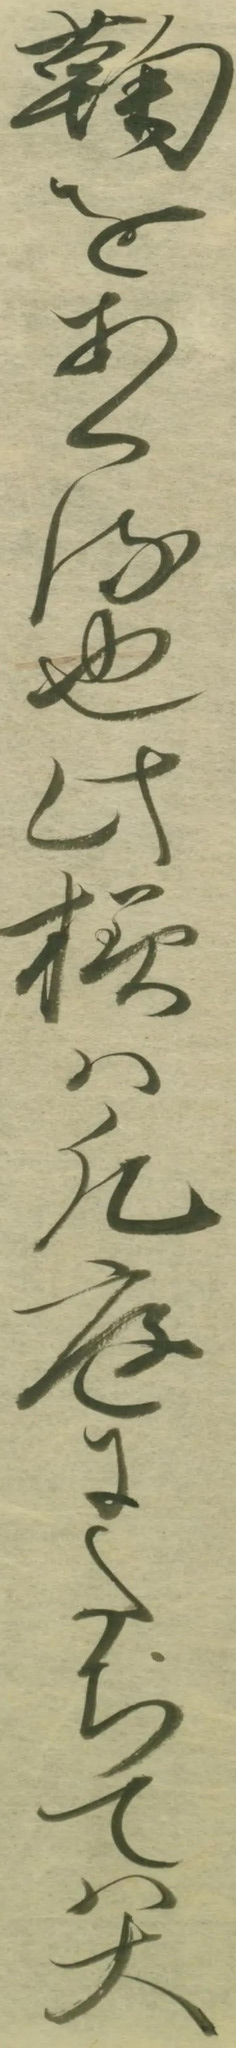鞠をあくる也此様は凡庭にたちては大
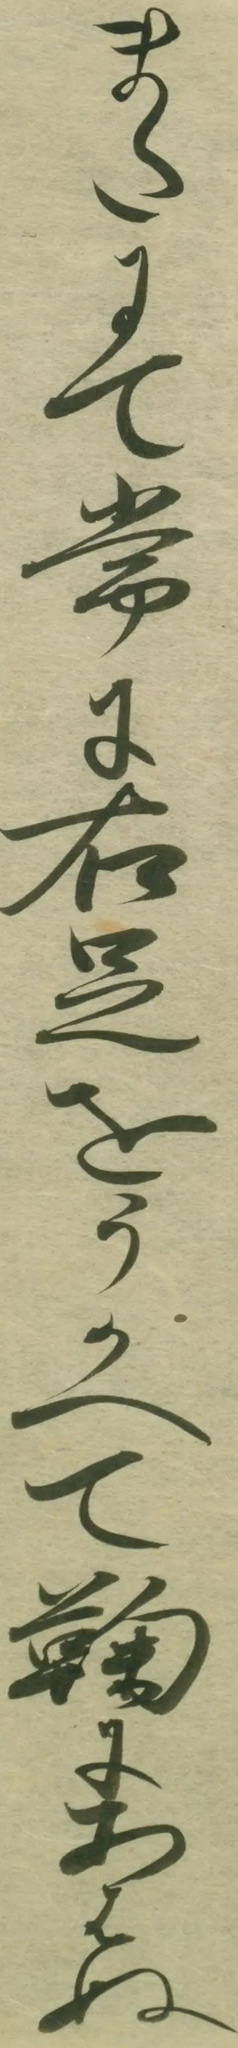またにて常に右足をうかへて鞠にあはぬ
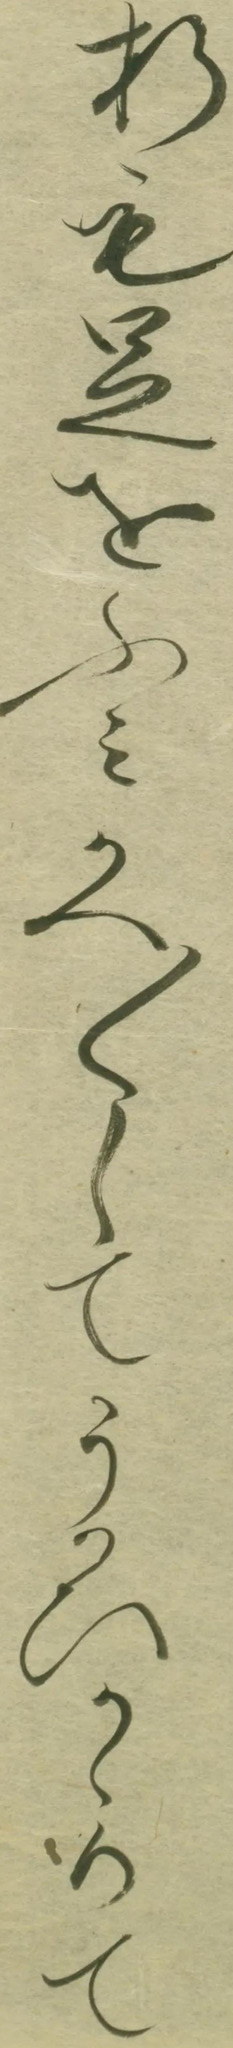折も足をふみかへ〳〵してうかひかゝめて
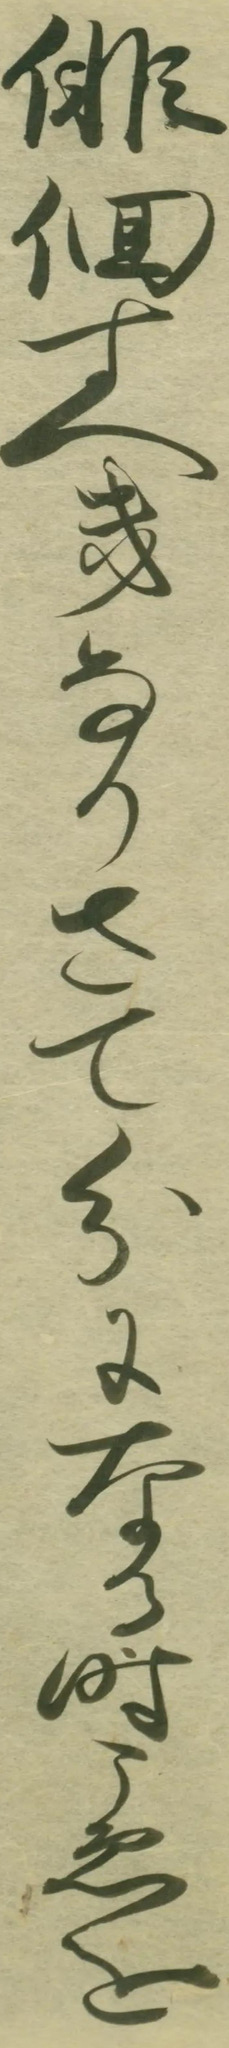俳佪すへきなりさて分になる時こゑを
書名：蹴鞠之条々大概
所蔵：国立国会図書館 National Diet Library, JAPAN
